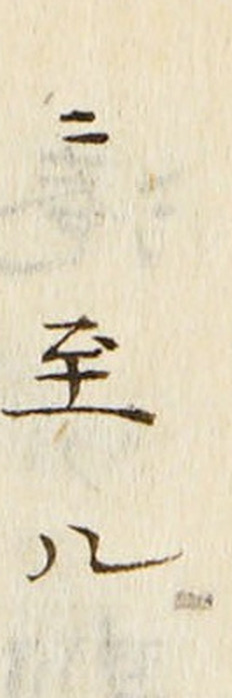ニ至ル
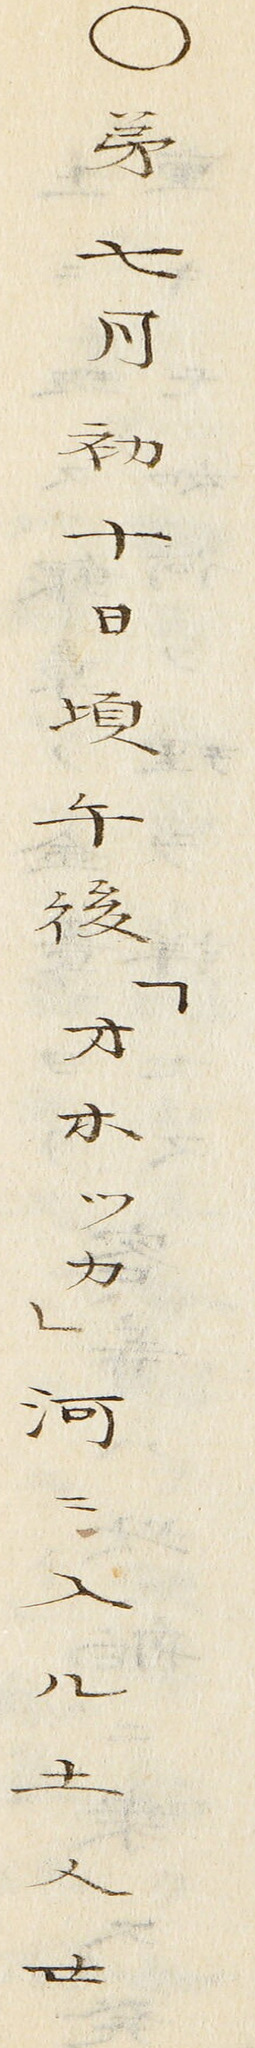〇第七月初十日頃午後「オホツカ」河ニ入ル土人廿
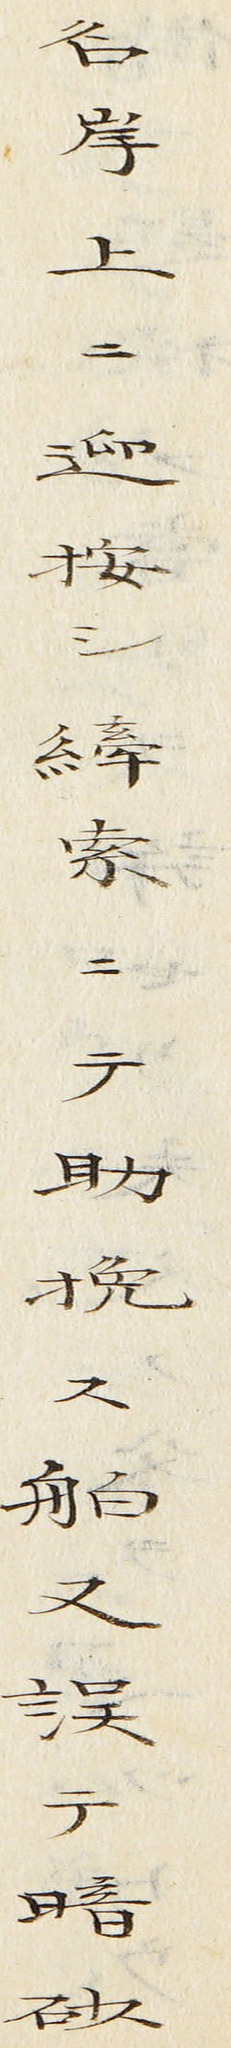名岸上ニ迎按シ縴索ニテ助挽ス舶又誤テ暗砂
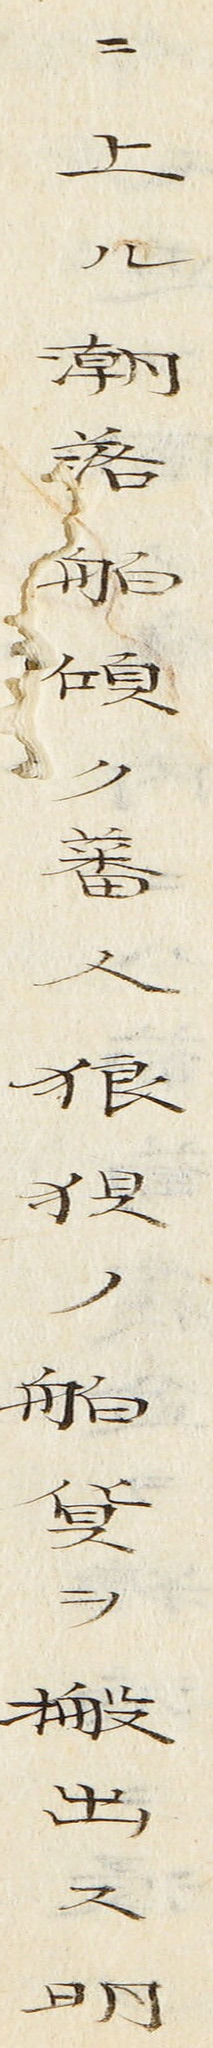ニ上ル潮落舶傾ク蕃人狼狽ノ舶貨ヲ搬出ス明
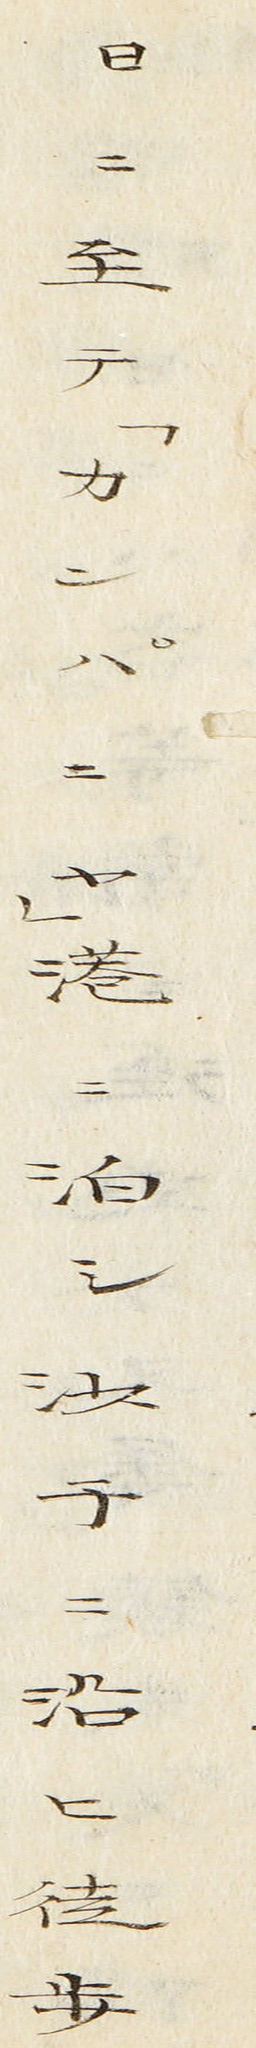日ニ至テ「カンパニヤ」港ニ泊シ沙子？ニ沿ヒ徒歩
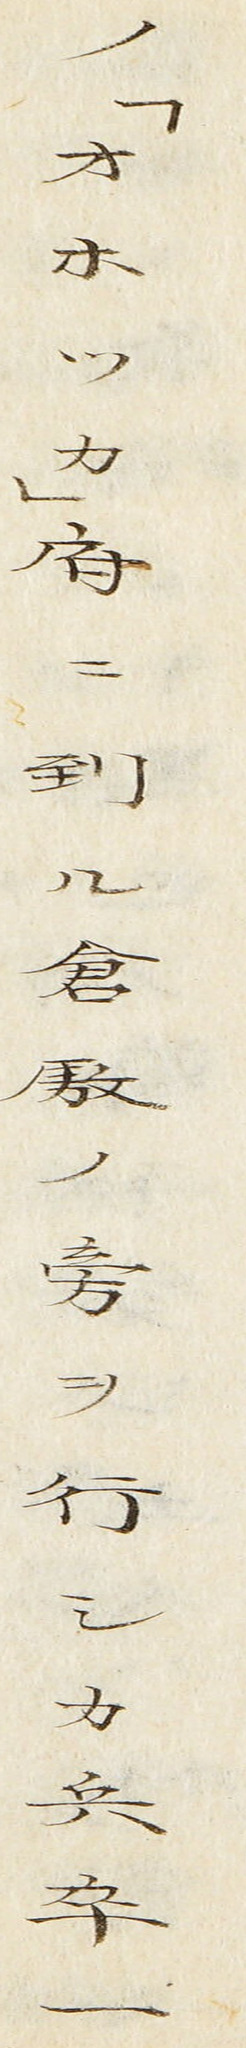ノ「オホツカ」府ニ到ル倉厫ノ旁ヲ行シカ兵卒一
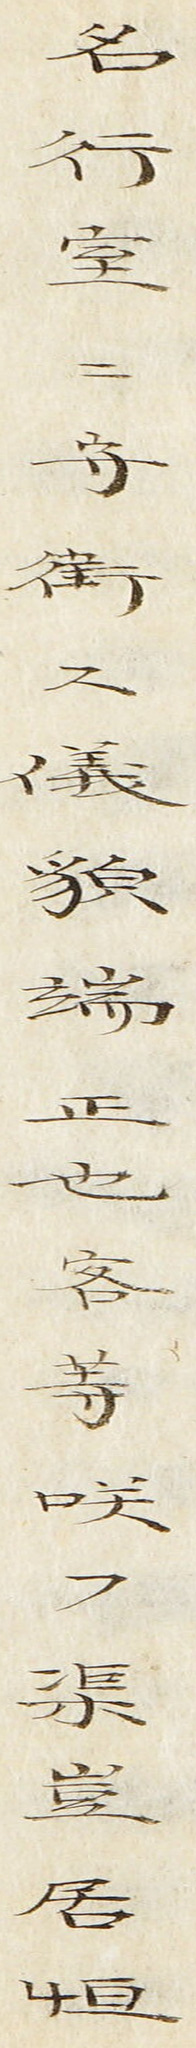名行室ニ守衛ス儀貌端正也客等咲フ渠豈居恒
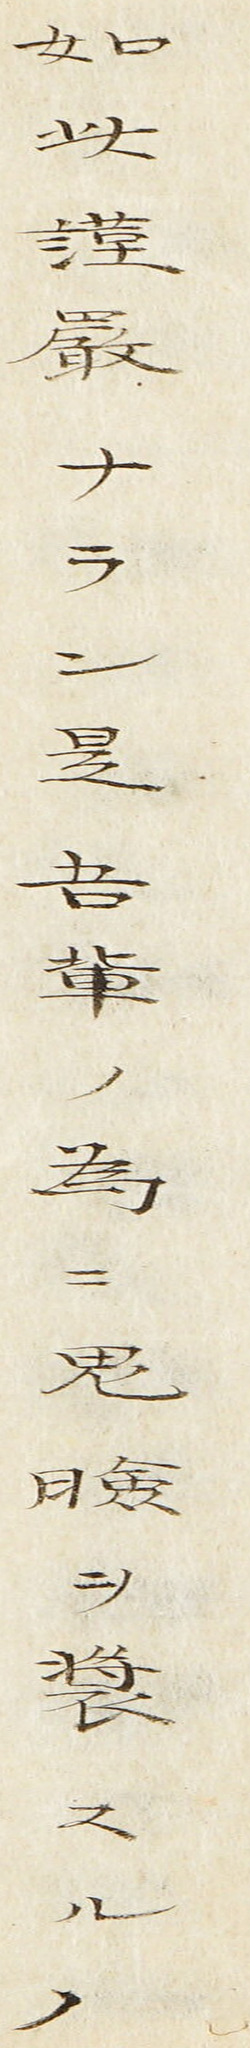如此謹厳ナラン是吾輩ノ為ニ瞼？ヲスルノ
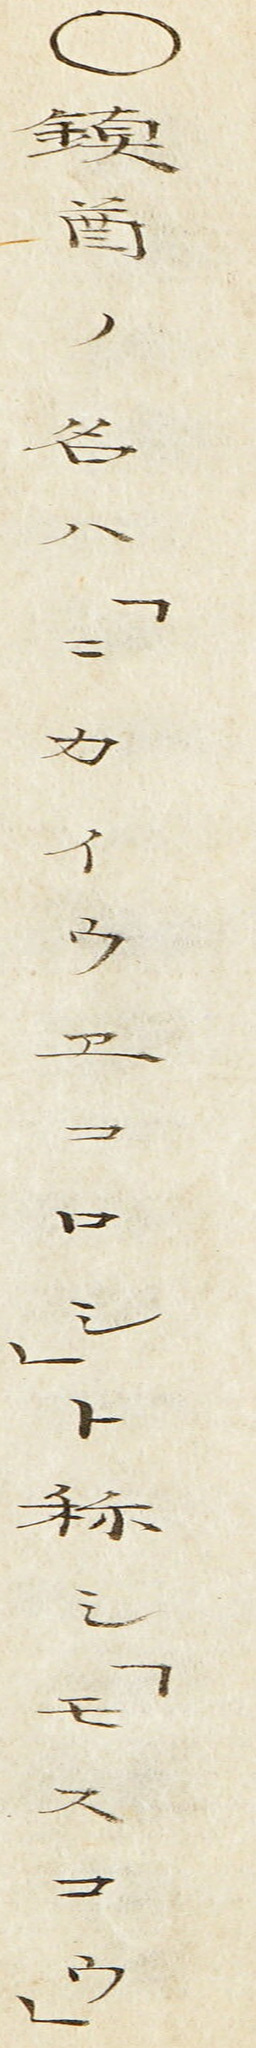〇鎮酋ノ名ハ「ニカイウヱコロシ」ト称シ「モスコウ」
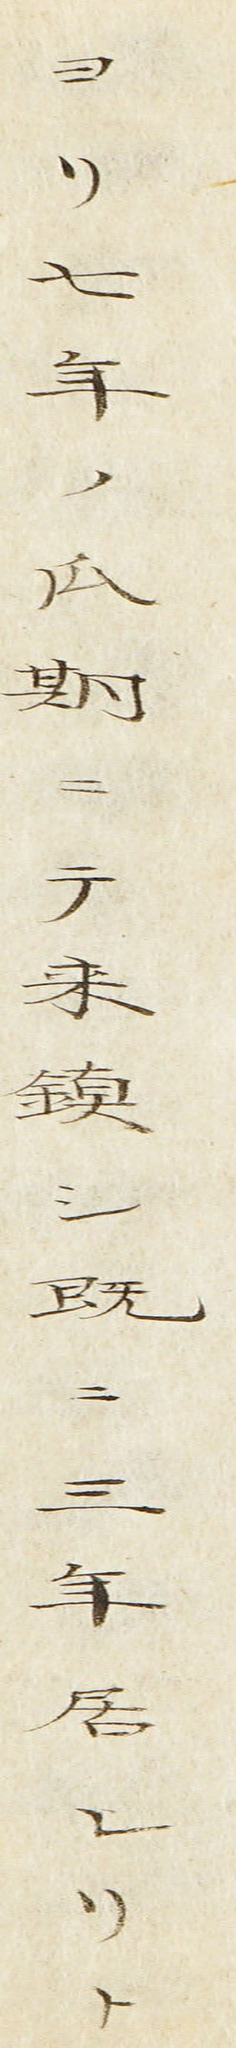ヨリ七年ノ瓜期ニテ来鎮シ既ニ三年居レリト
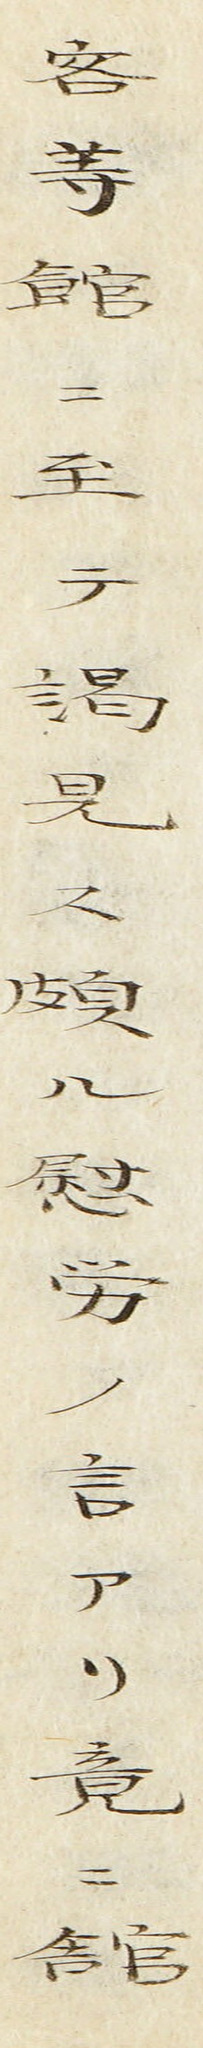客等館ニ至テ謁見ス頗ル慰労ノ言アリ竟ニ館

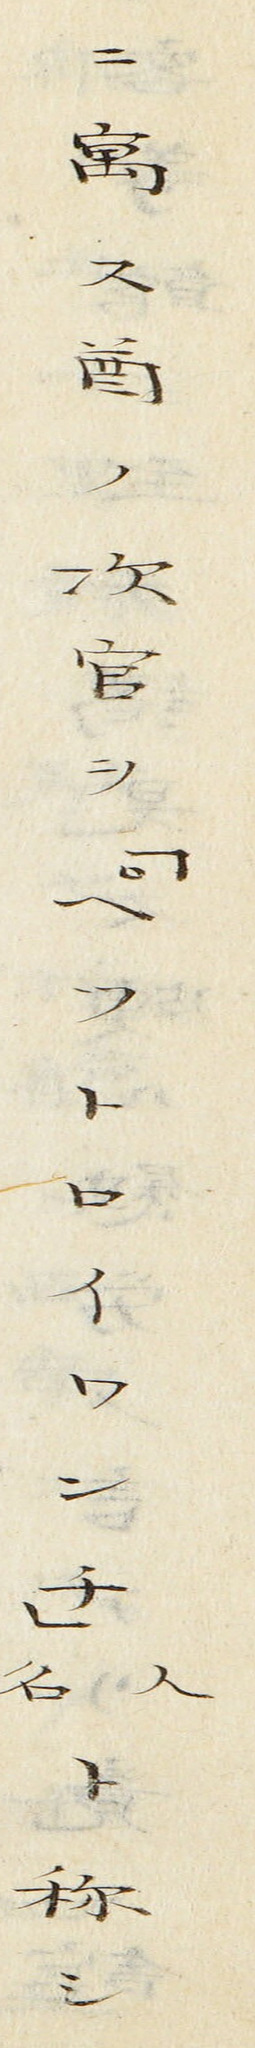ニ寓ス酋ノ次官ヲ「ペツトロイワンチ」人名ト称シ
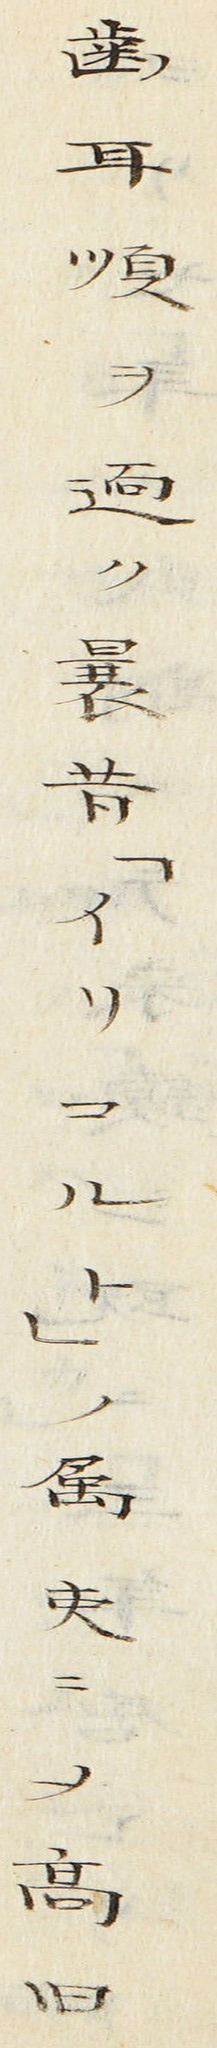歯耳順ヲ過ク曩昔「イリリコルト」ノ属吏ニシテ高旧
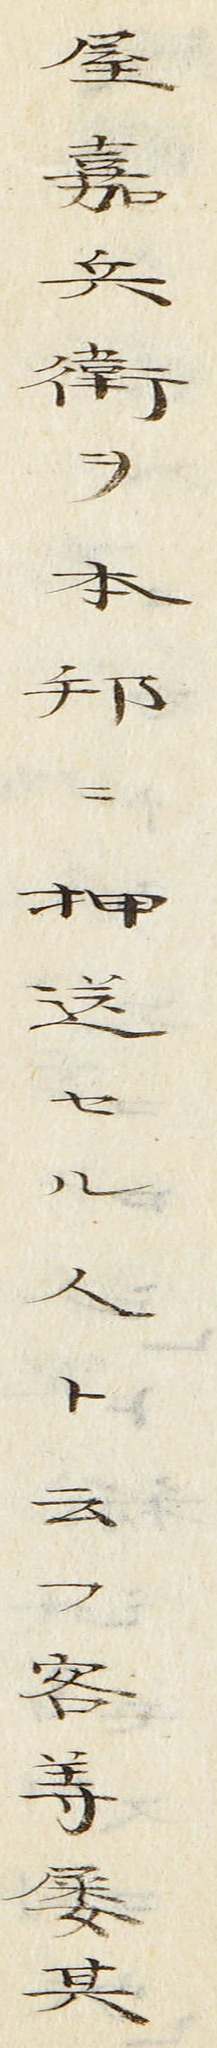屋嘉兵衛ヲ本邦ニ押送セル人ト云フ客等屡其
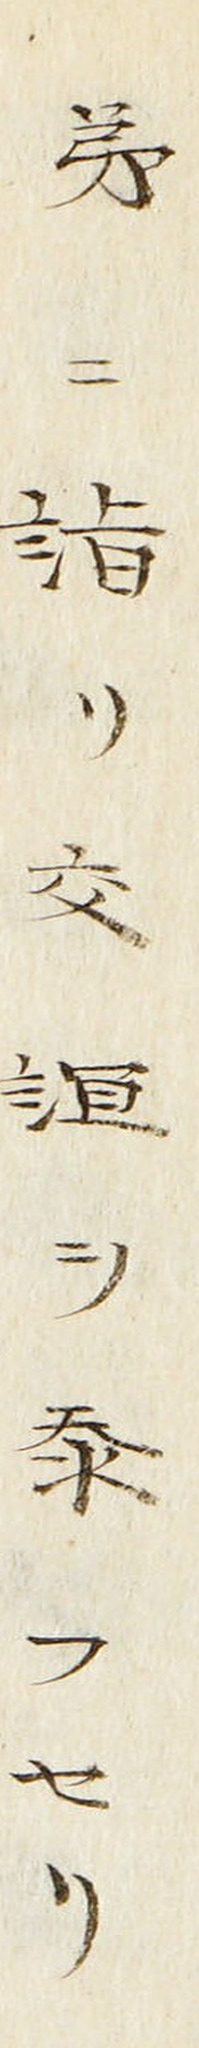弟ニ詣リ交誼ヲ泰フセリ
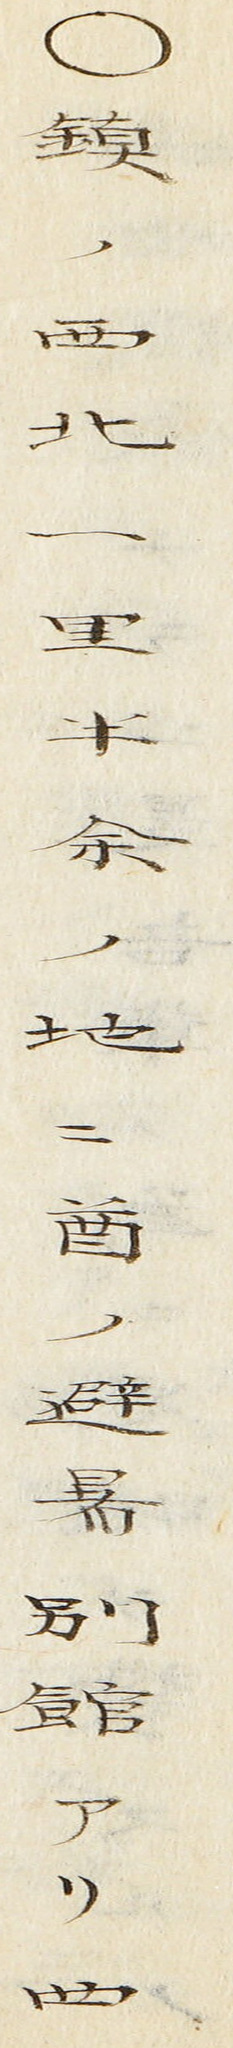〇鎮ノ西北一里半余ノ地ニ酋ノ避暑別館アリ四
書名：蕃談
